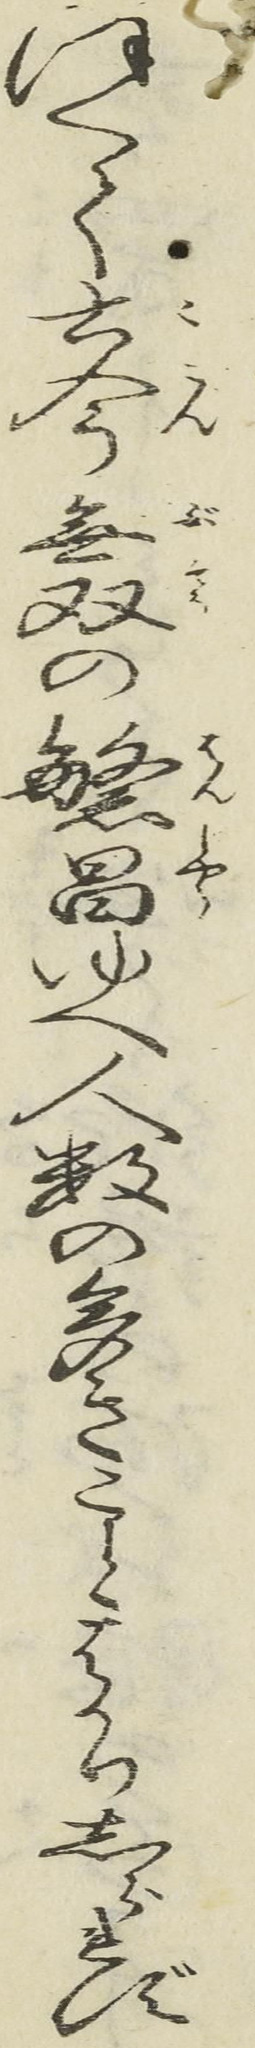ほへて古今無双の繁昌ゆへ人数の多きことはかりしられず
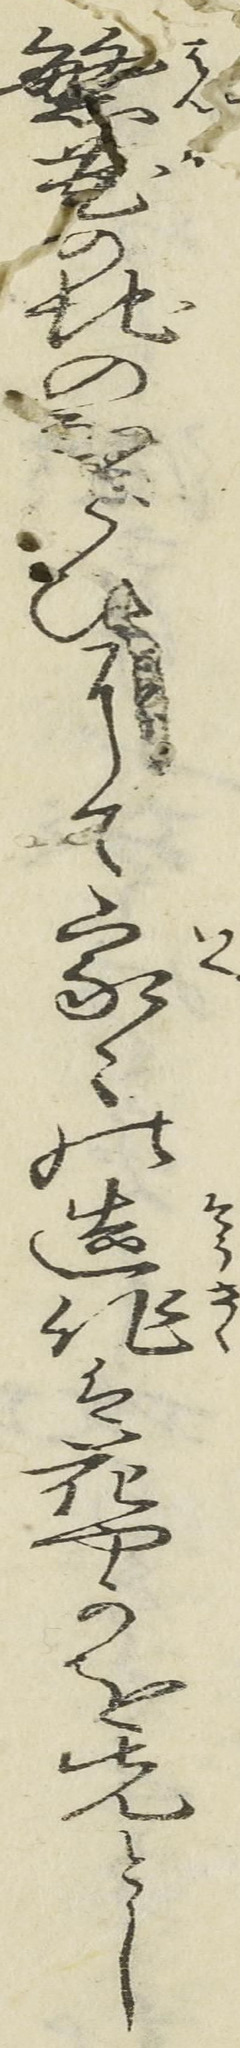繁華の地のらひにて家々の造作は花やかを先とし
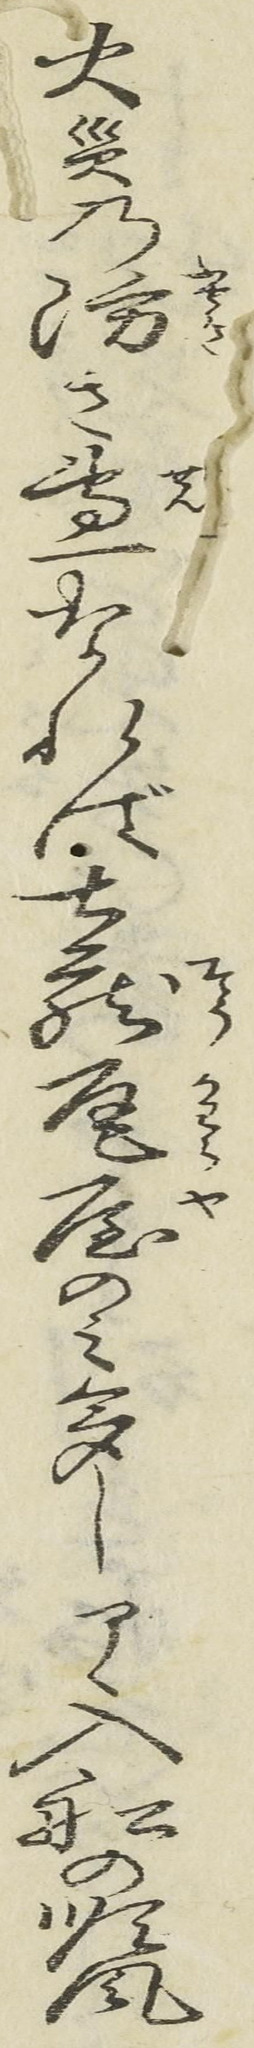火災の防き専一なれば土蔵瓦屋のみ多しアゝ入船の順風
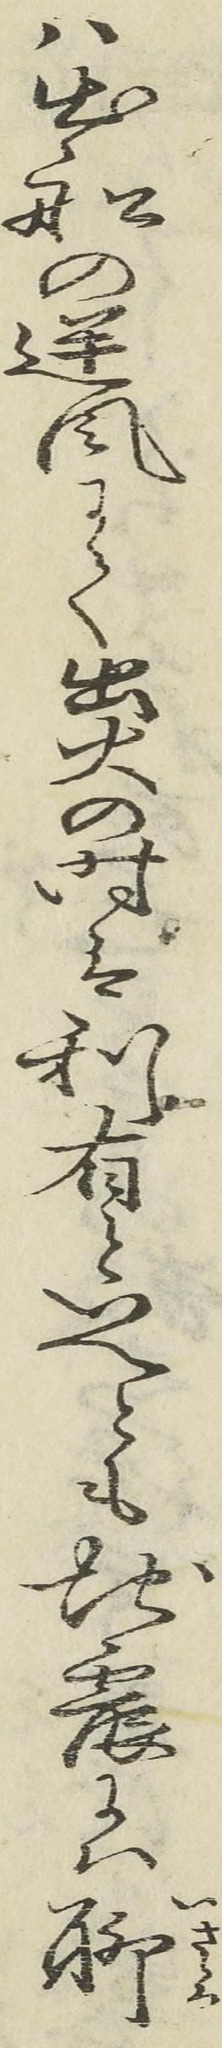は出舩の逆風にて出火の時は利有といへとも地震には聊
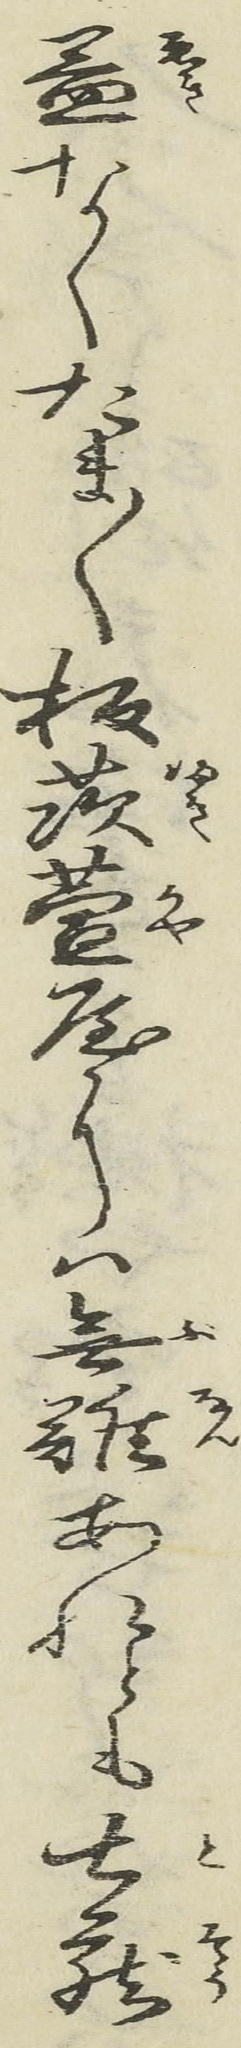益なくたま〳〵板茨萱屋には無難あれとも土蔵
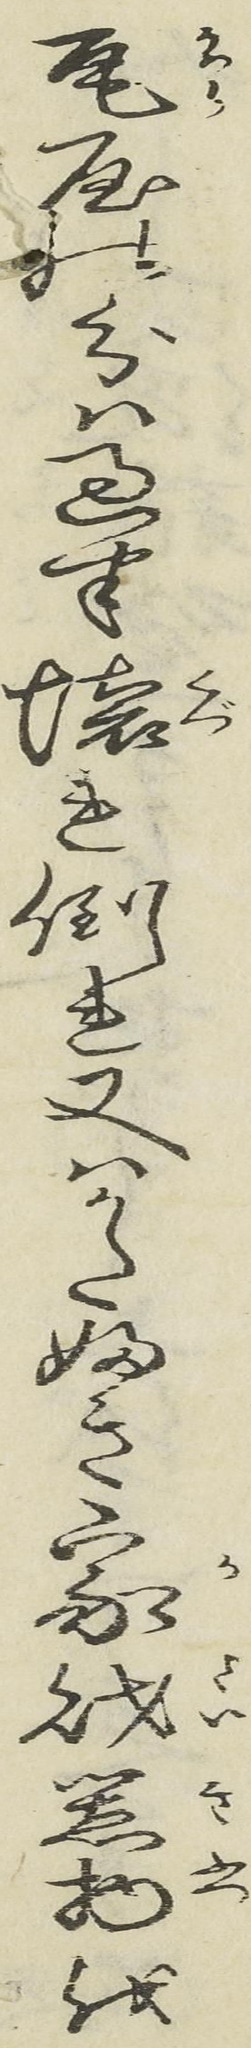瓦屋の分は過半壊れ倒れ又はかたふき家財器物を
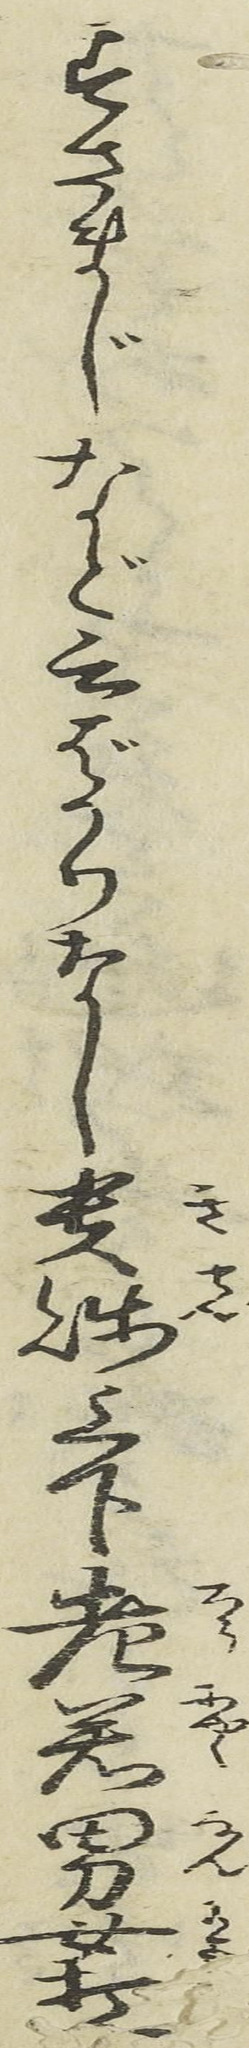すさまじなど云ばかりなし貴賤上下老若男女打

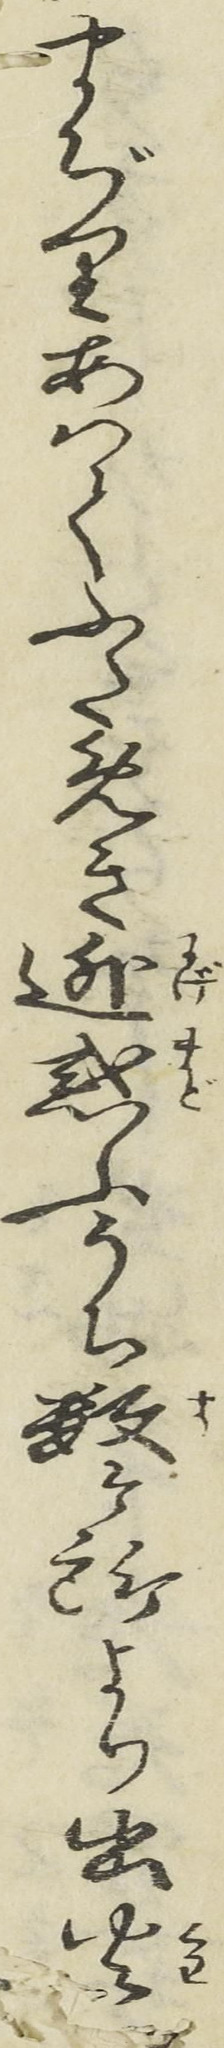まぢりあはてふためき逃惑ふうち数ヶ所より出火
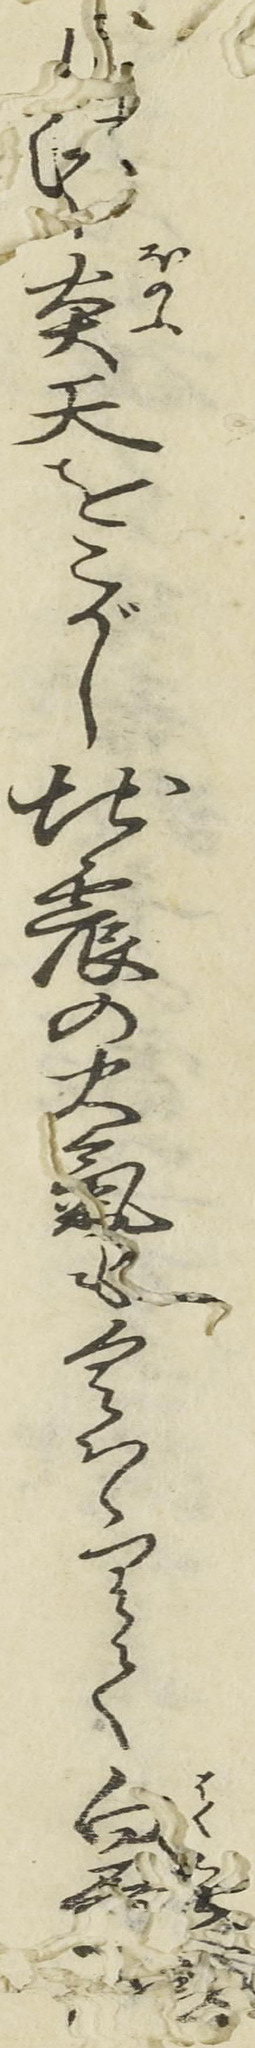炎天をこがし地震の火気もくはゝりて白昼
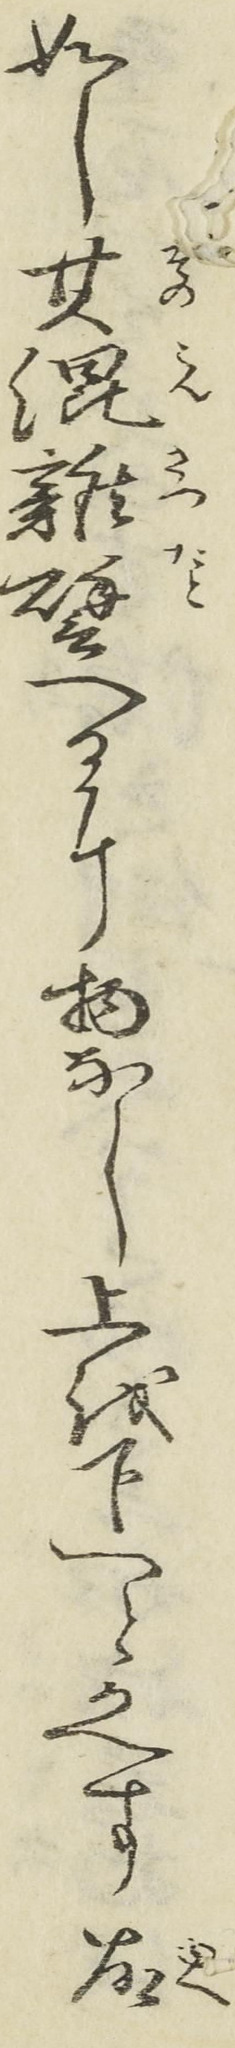如し其混雑譬へるに物なし上を下へとかへす故
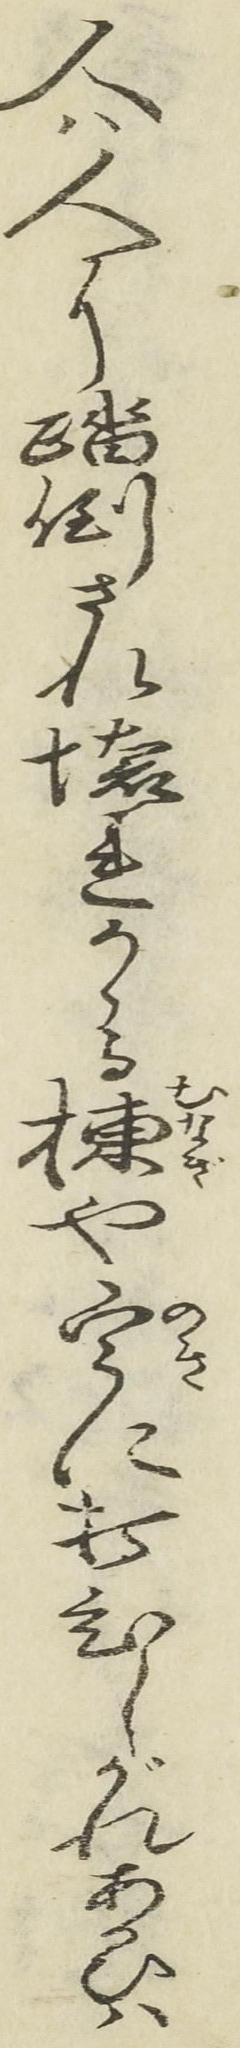人は人に踏倒され壊れかゝる棟や宇に打ひしがれあるひは
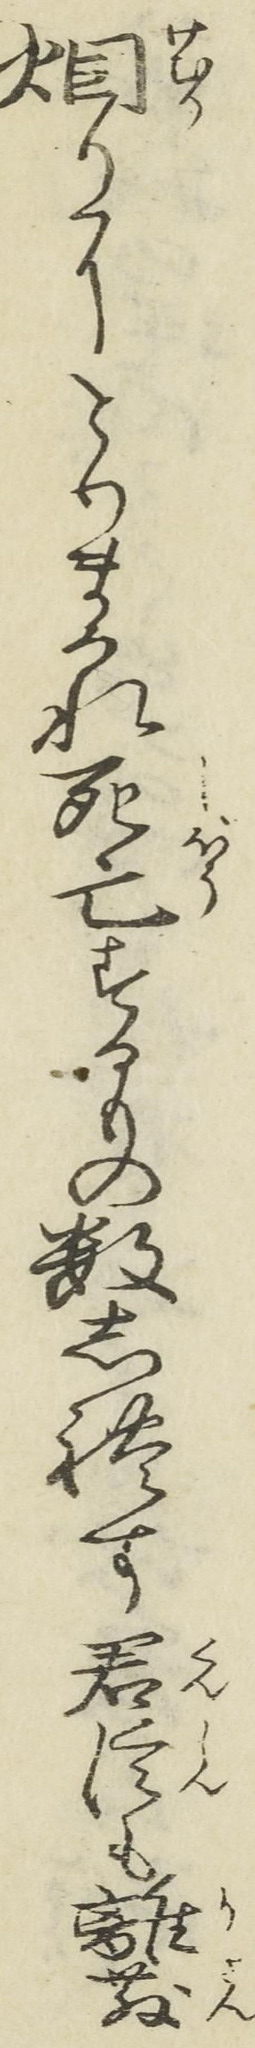烟りにとりまかれ死亡するもの数しれす君臣も離散
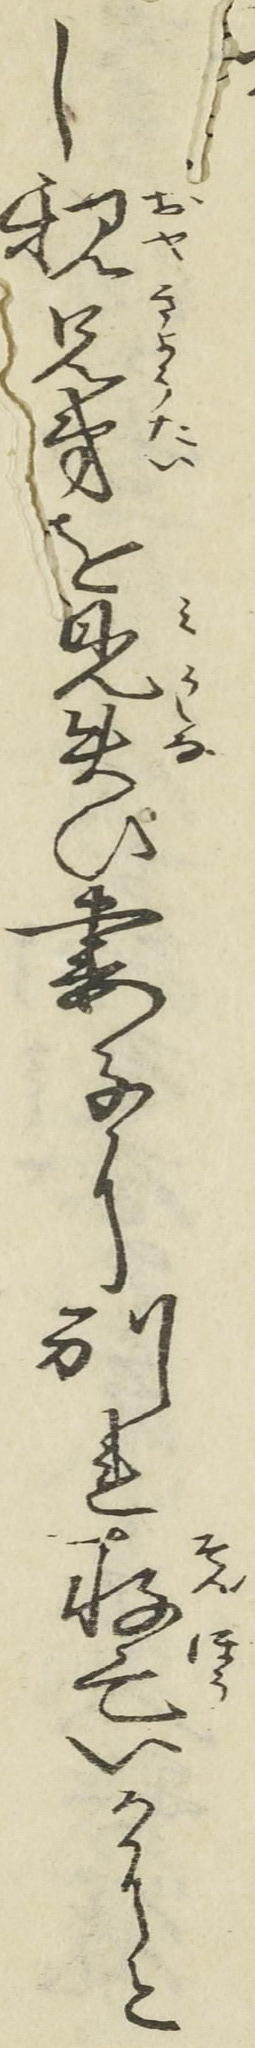し親兄弟を見失ひ妻子に別れ存亡いかにと
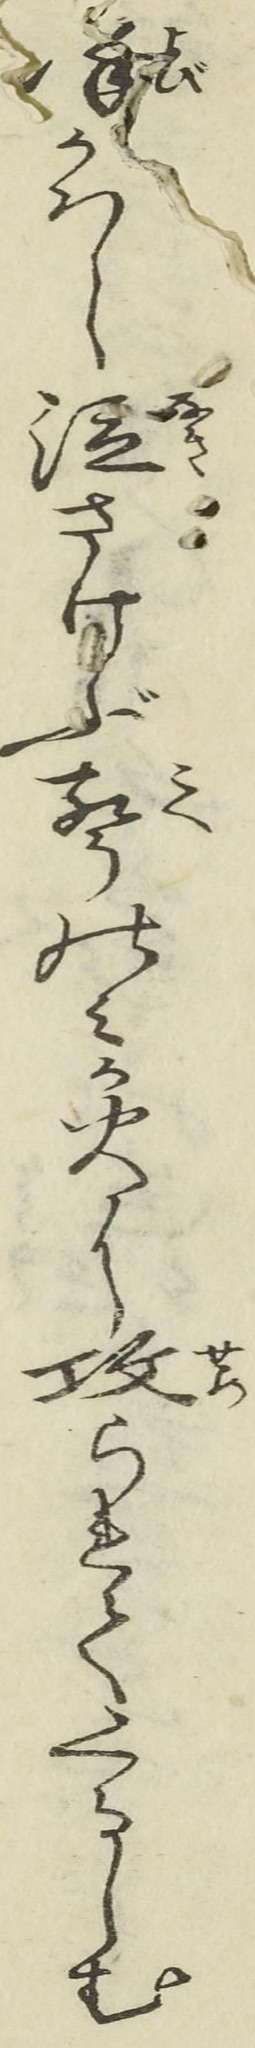呼かはし泣さけぶ声のみか火に攻られてくるしむ
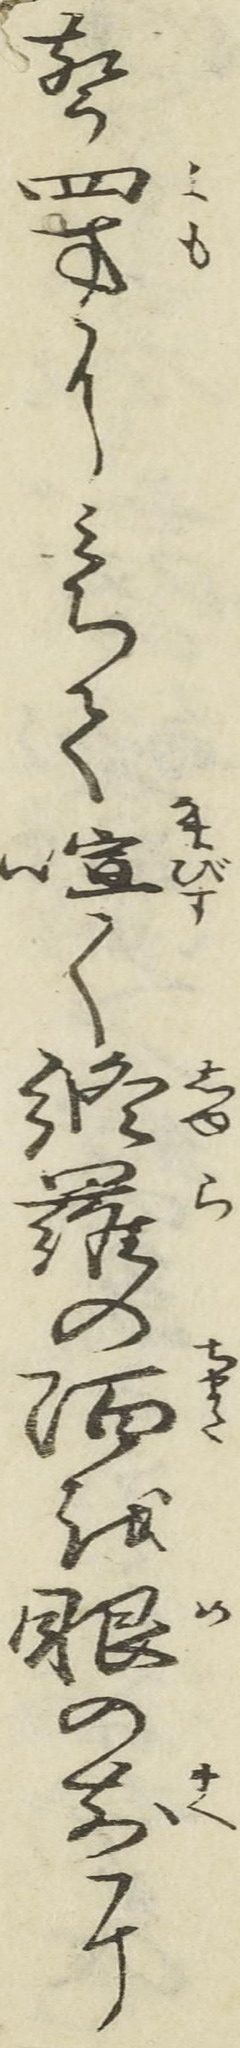声四方にみちて喧〳〵修羅の陌を眼の前に
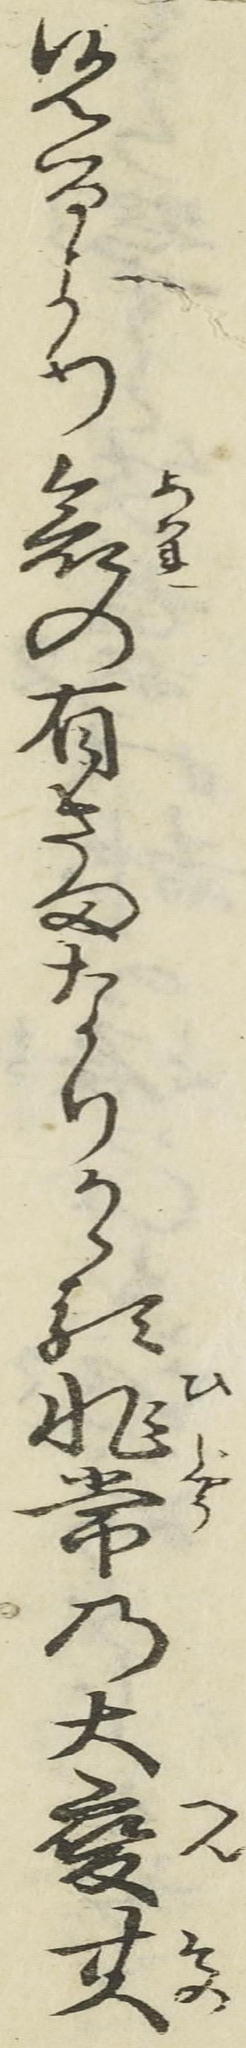見るより哀の有さまなりかゝる非常の大変其
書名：震雷考説　全
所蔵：東京大学地震研究所図書室 Earthquake Research Institute Library, The University of Tokyo, JAPAN
